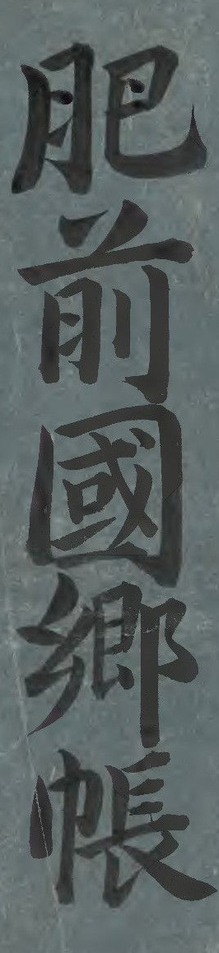肥前国郷帳

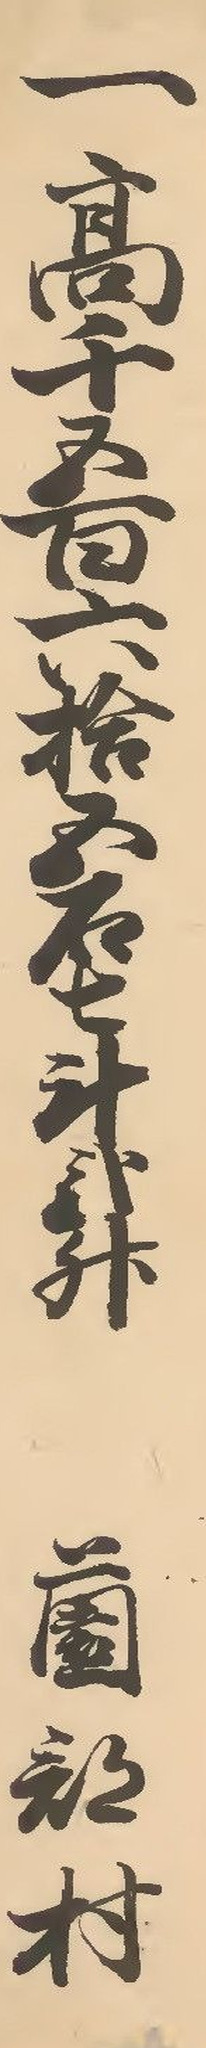一髙千五百六拾五石七斗弐升薗部村
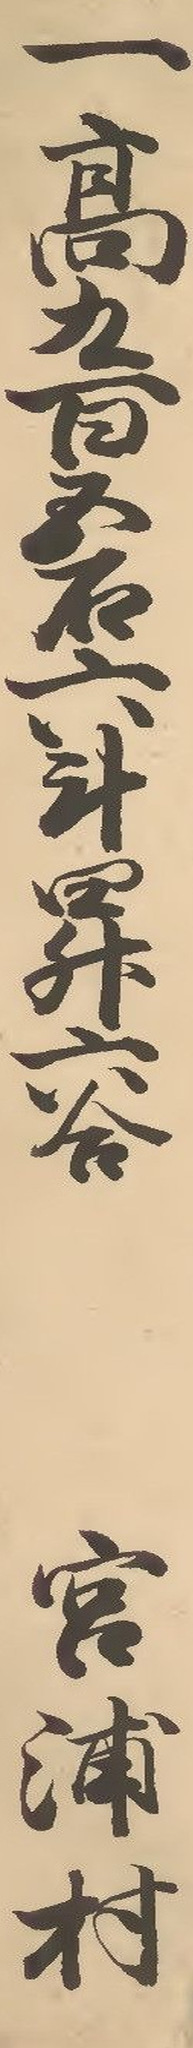一髙九百五石六斗四升六合宮浦村

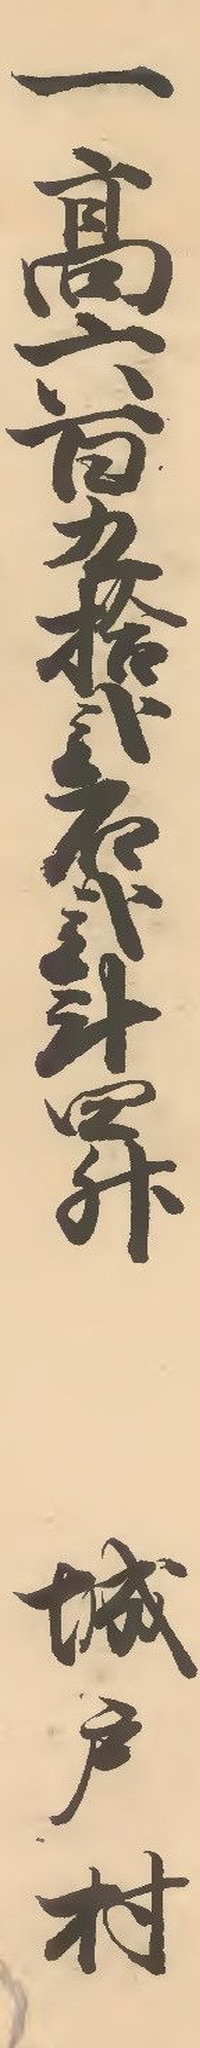一髙六百九拾弐石弐斗四升城戸村
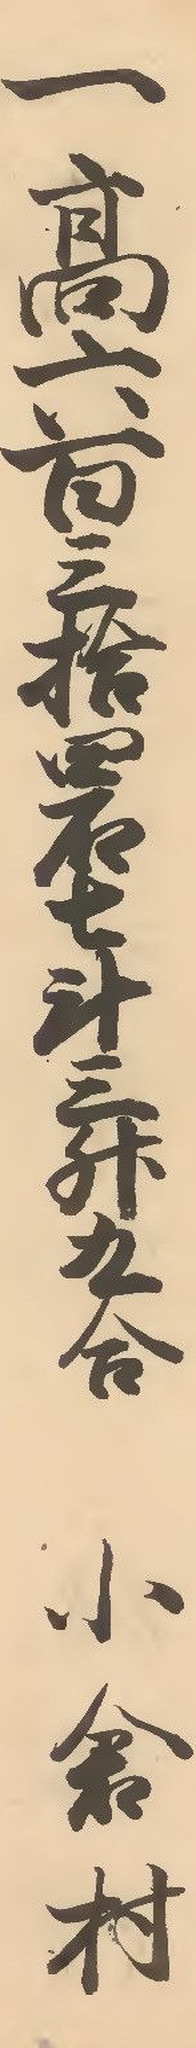一髙六百三拾四石七斗三升九合小倉村
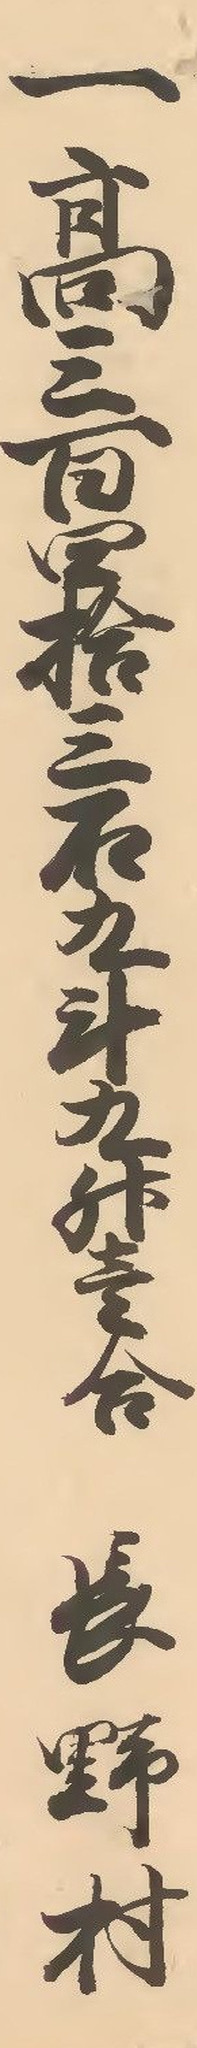一髙三百四拾三石九斗九合壱合長野村
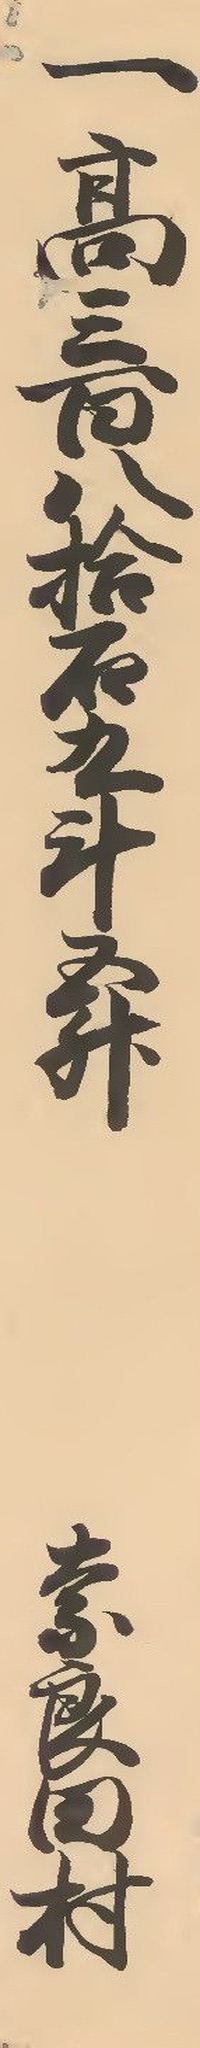一髙三百八拾石九斗五升奈良田村
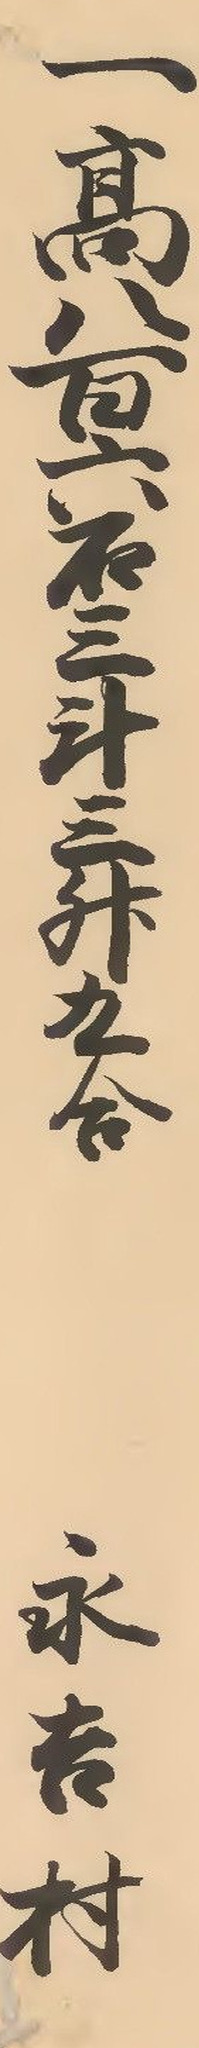一髙八百六石三斗三升九合永吉村
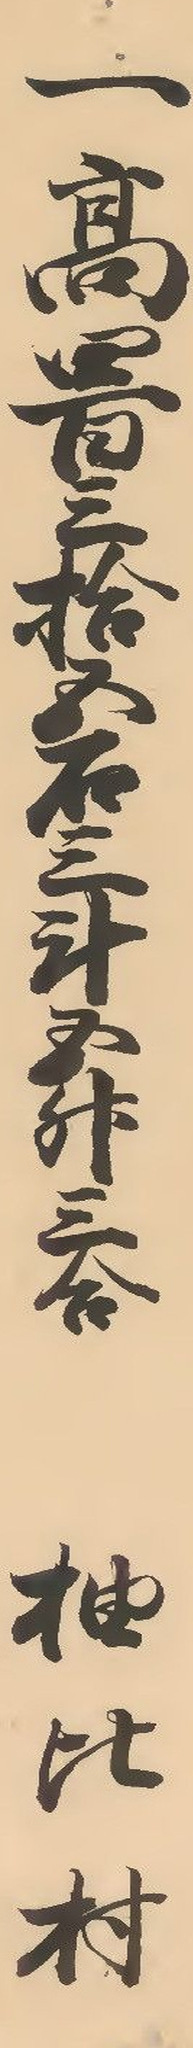一髙四百三拾五石三斗五升三合柚比村
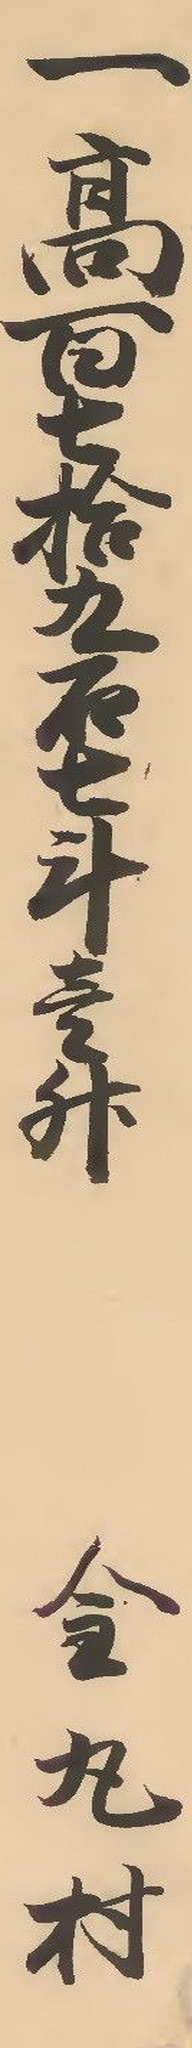一髙百七拾九石七斗壱升金丸村

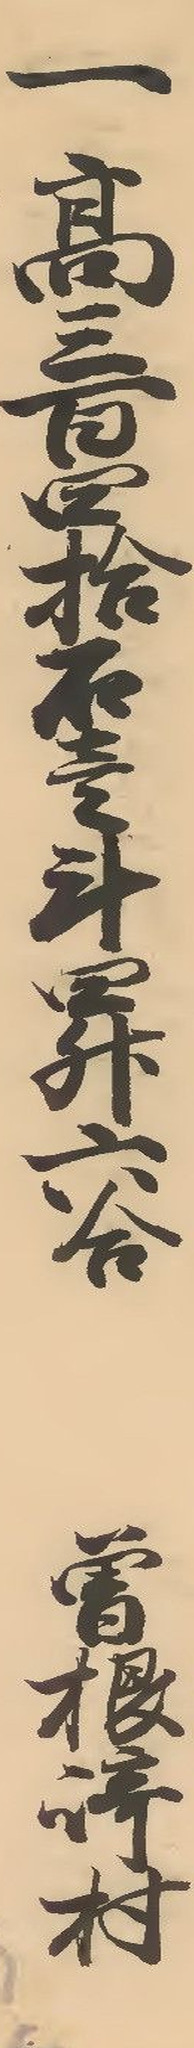一髙三百四拾石壱斗四升六合曽根崎村
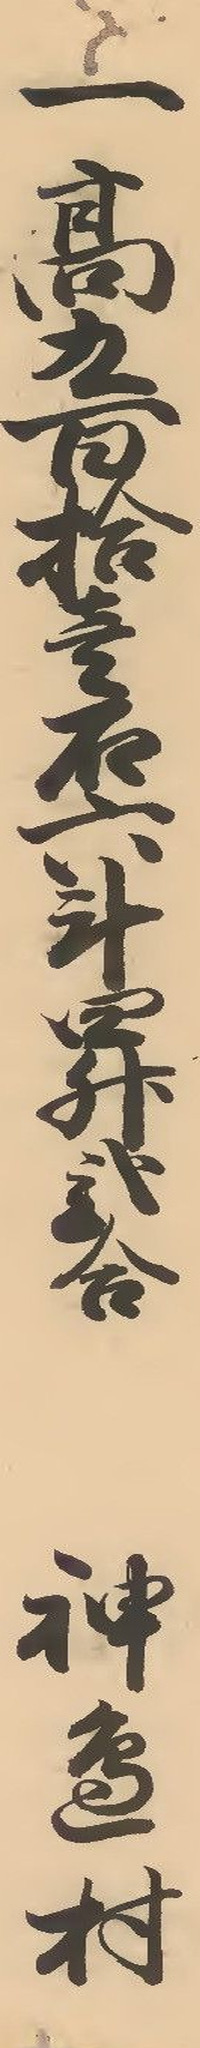一髙九百拾壱石六斗四升弐合神邊村
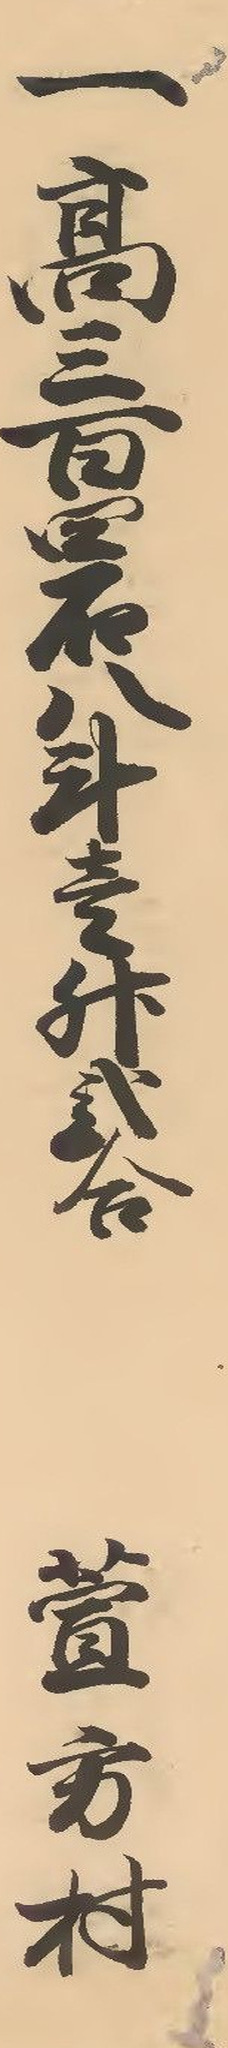一髙三百四石八斗壱升弐合萱方村
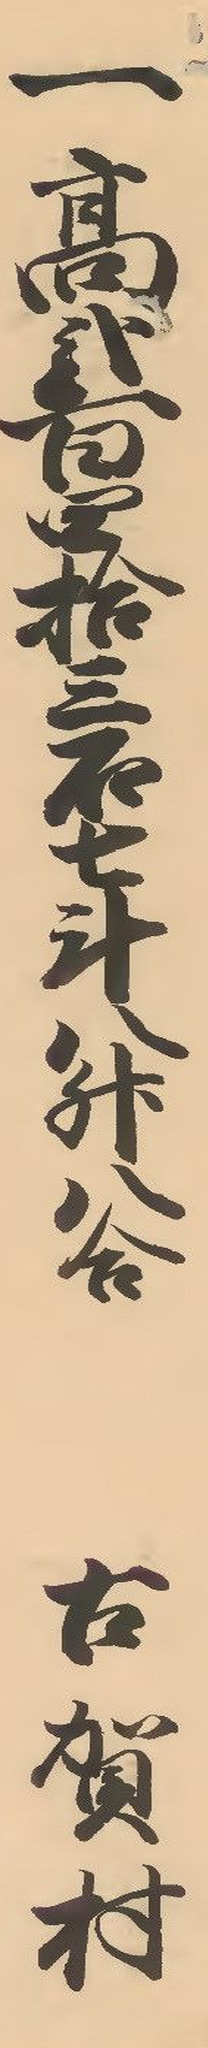一髙弐百四拾三石七斗八升八合古賀村
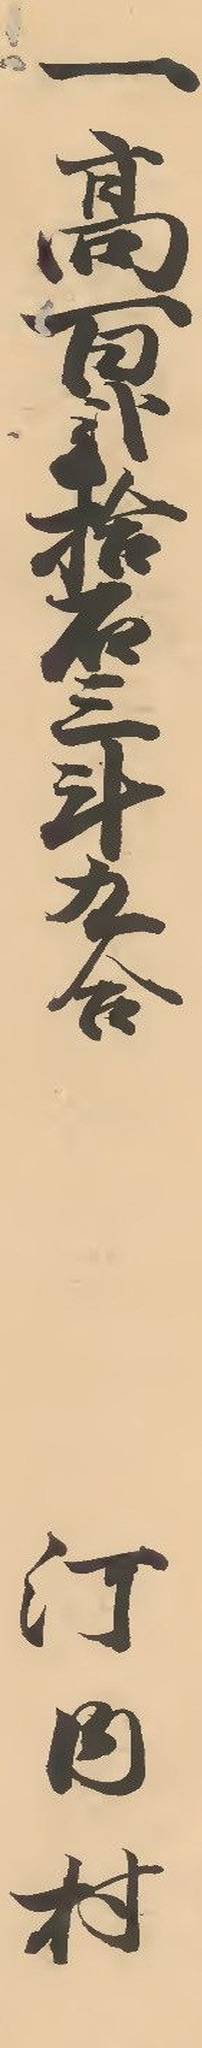一髙百弐拾石三斗九合河内村
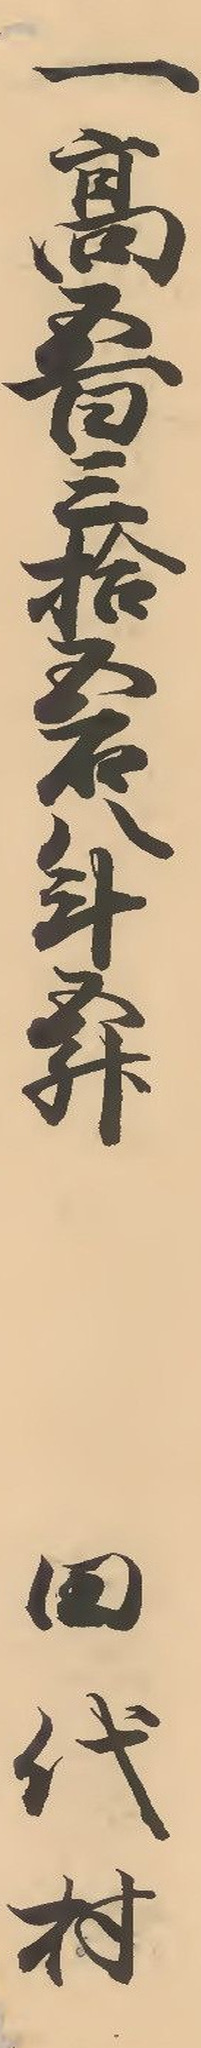一髙五百三拾五石八斗五升田代村
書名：肥前国郷帳
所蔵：国立公文書館 National Archives of Japan
